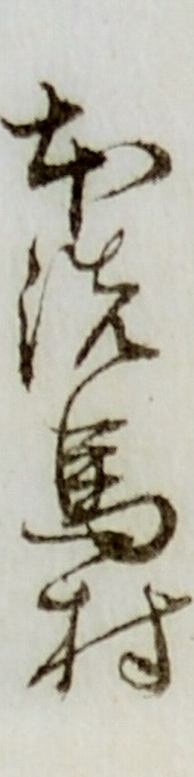本洗馬村
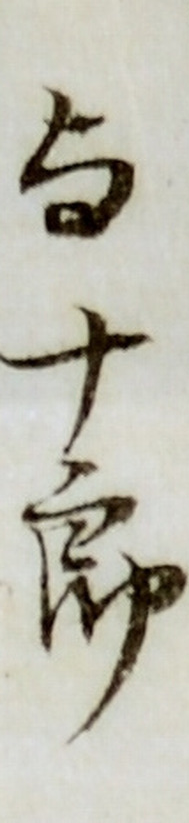与十郎
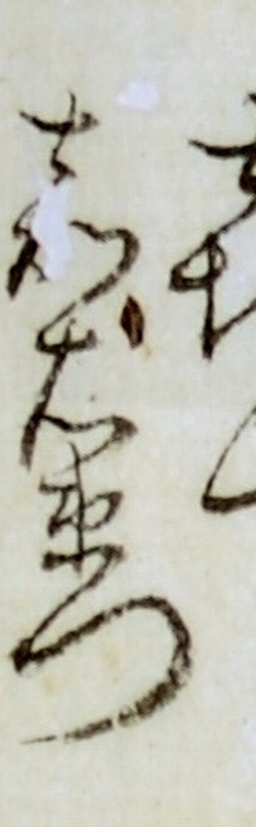嘉右衛門

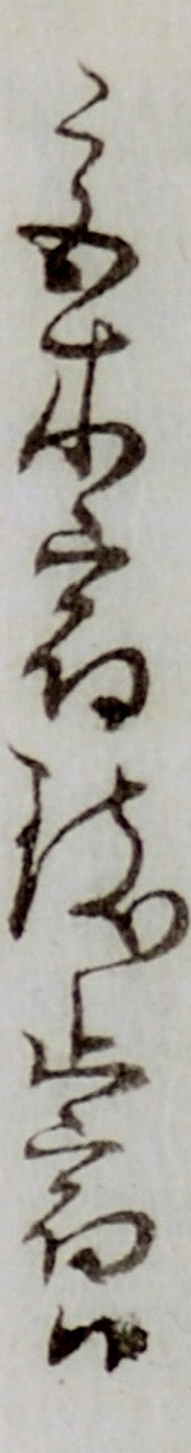宮木宿致止宿候

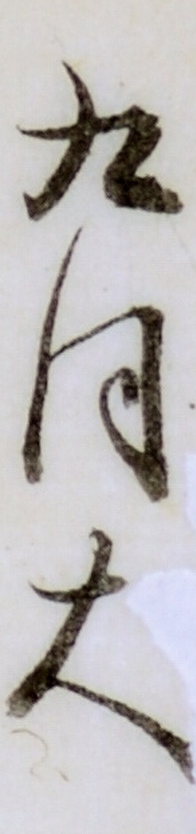九月大
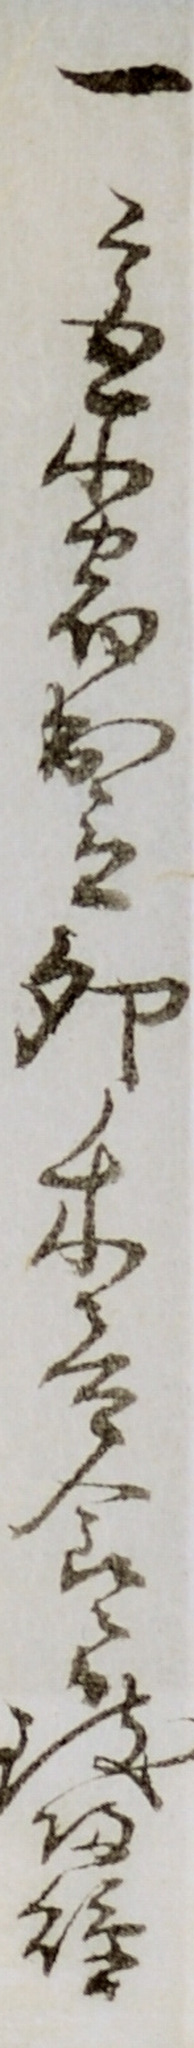一宮木宿出立卯ノ木昼食にて致帰県候
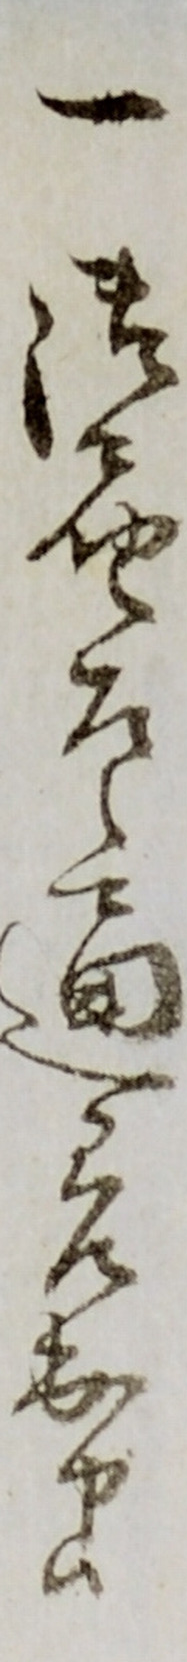一御届左之通差出申候
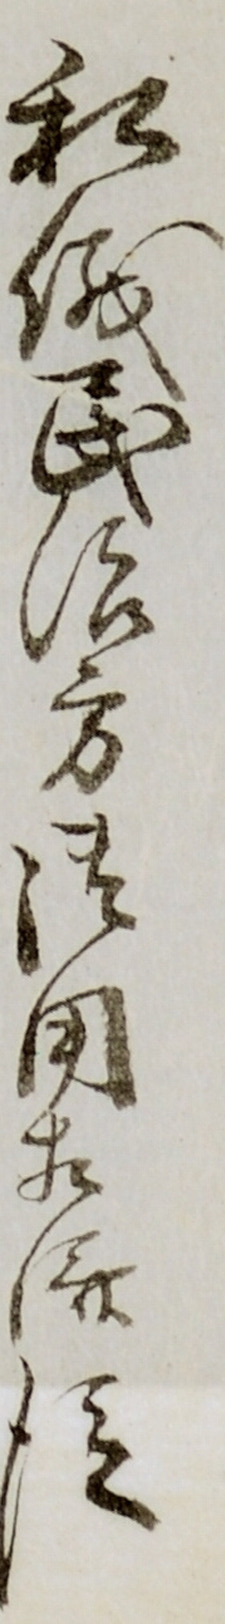私儀民治方御用相済従
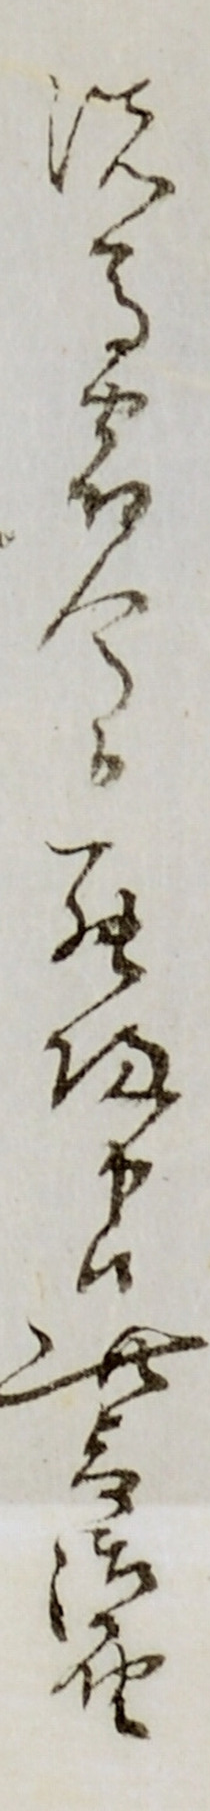洗馬宿今日罷帰申候此旨御届
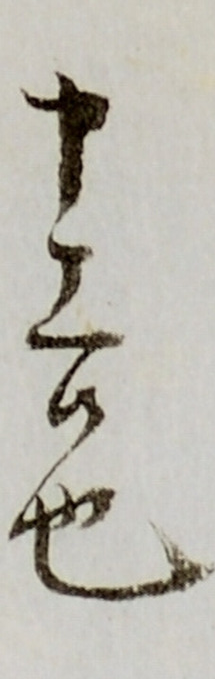申上候也
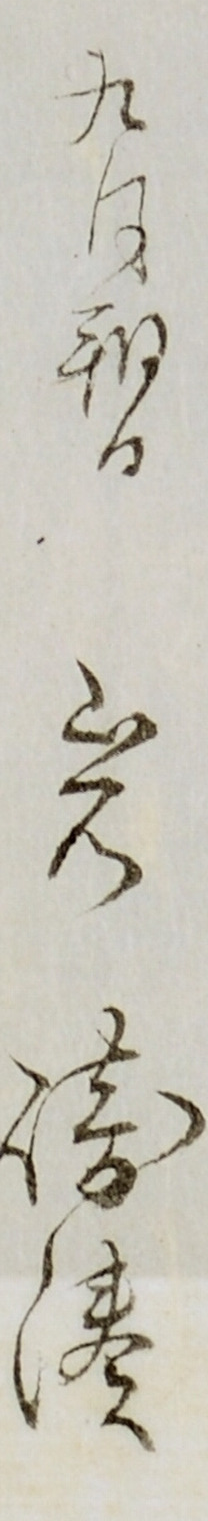九月朔日岩崎湊
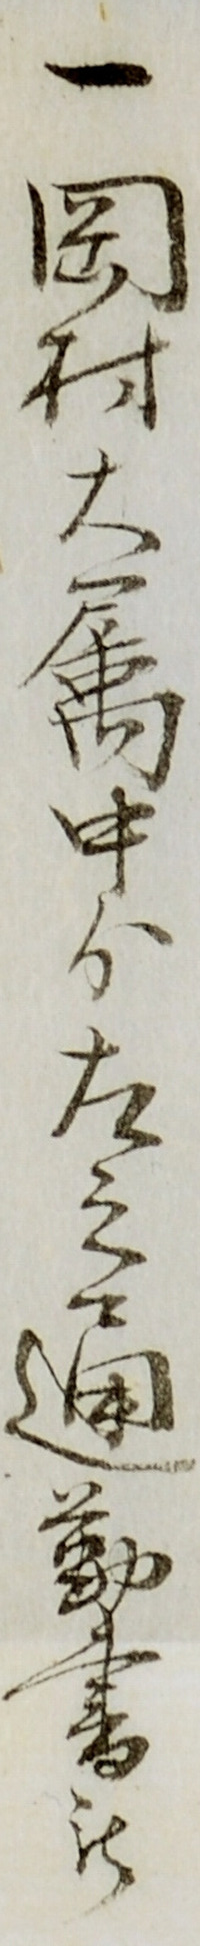一岡村大属中ゟ左之通勤書被
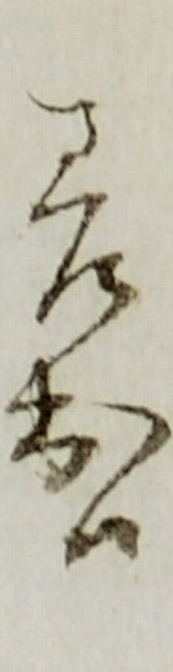差出候
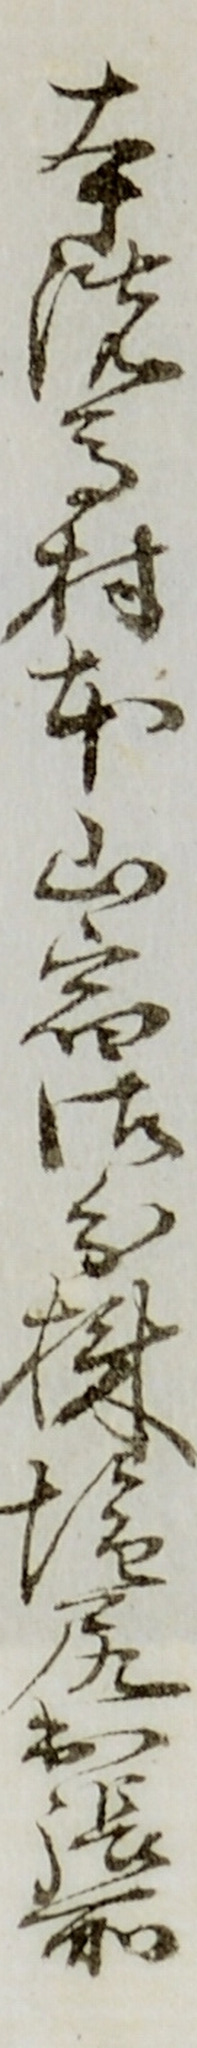本洗馬村本山宿御分株塩尻出張所
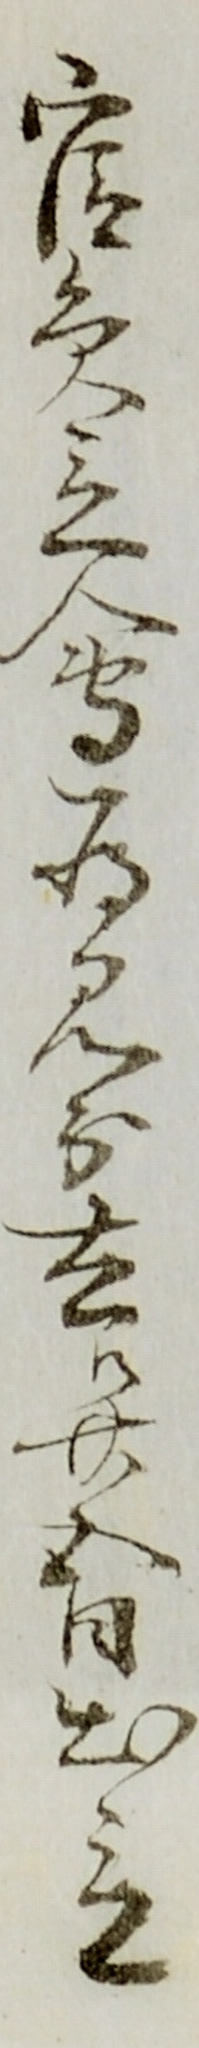官員立会為見分去ル廿五日出立
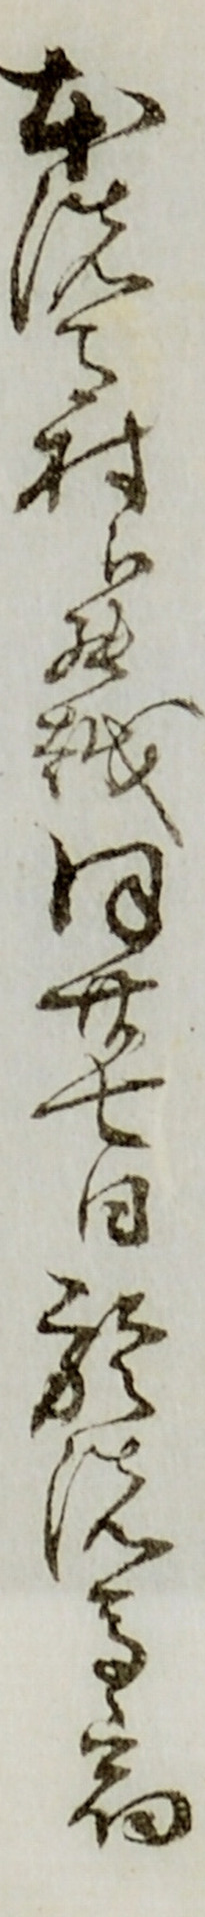本洗馬村え罷越同廿七日於洗馬宿
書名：山林方諸事御用留
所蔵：伊那市立高遠町図書館・合同会社AMANE
